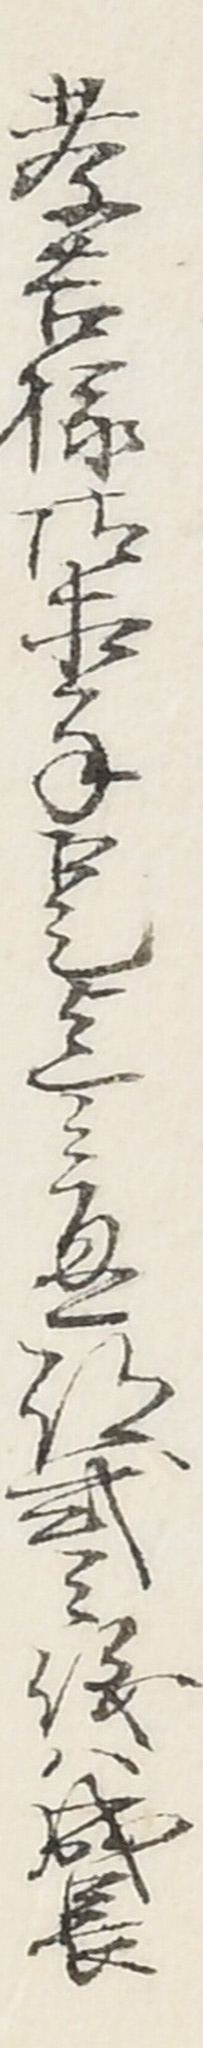孝吉様御相手是迄之通跡式之儀ㇵ成長
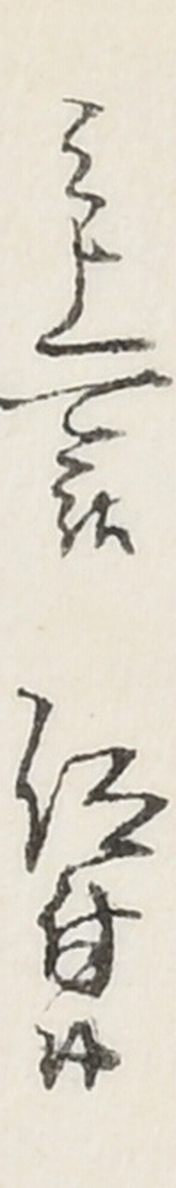之上可被仰付候
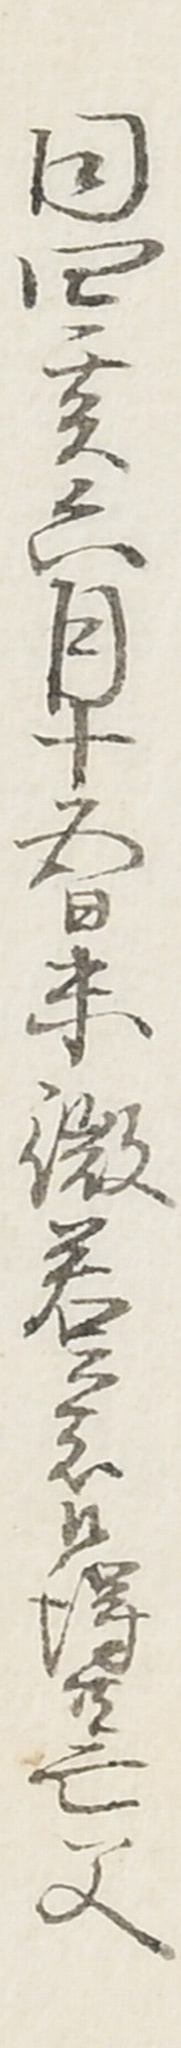一同四亥六月十五日未微若ニ者候得共亡父
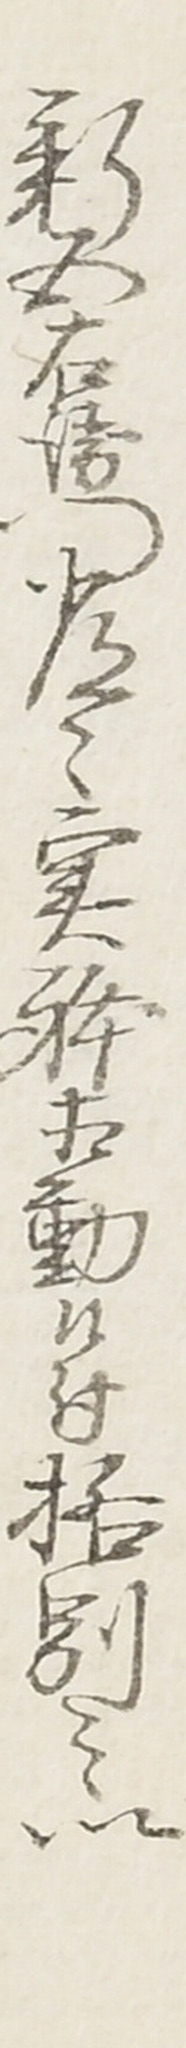新五右衛門常々実躰相勤候付格別之以
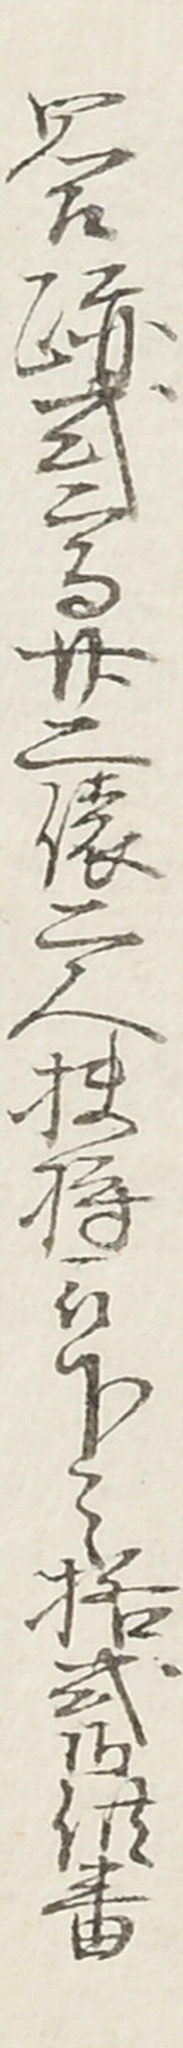思召跡式高廿二俵二人扶持被下之格式御供番
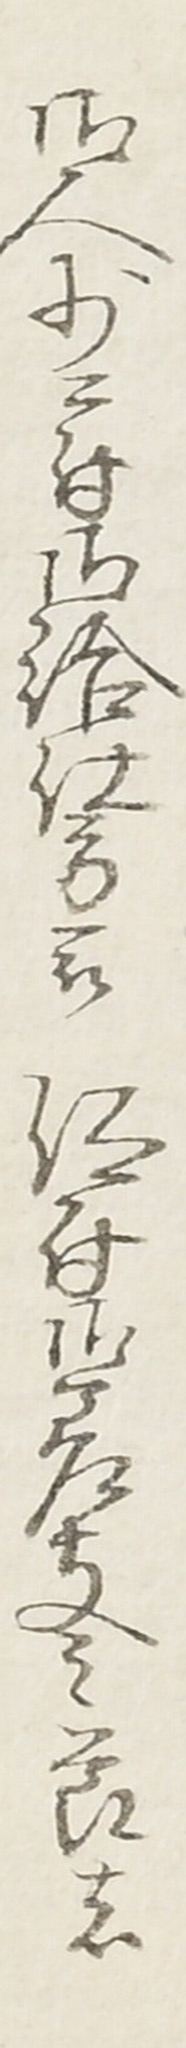御人少ニ付御給仕方被仰付御差支之節者
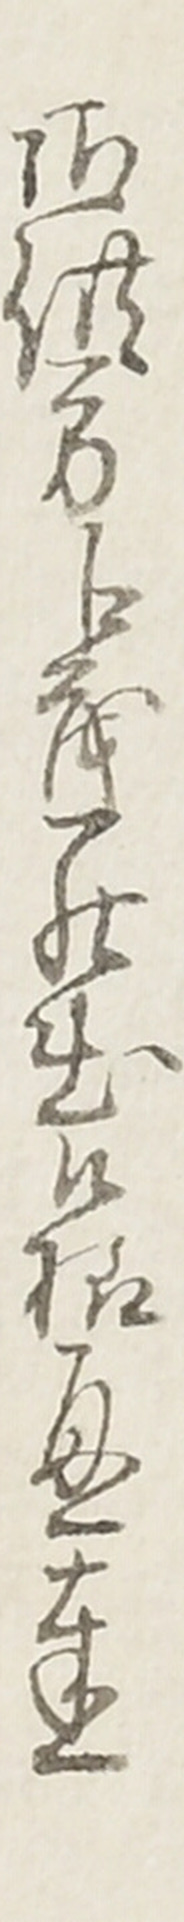御供方江茂罷出候様通達
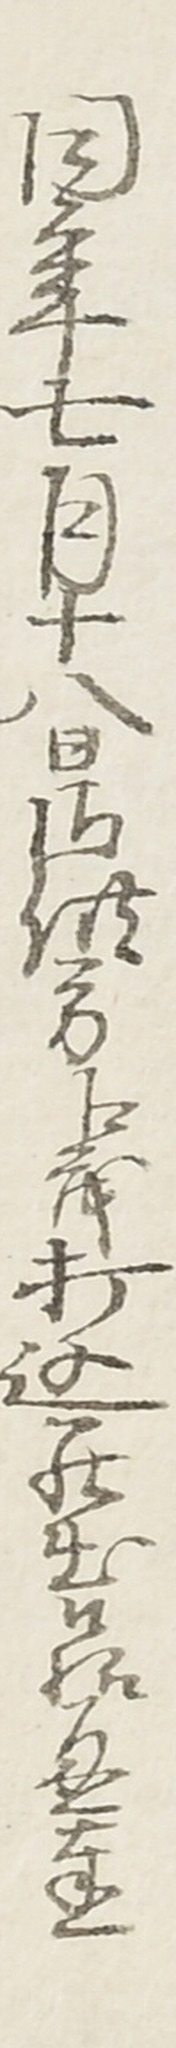一同年七月十八日御供方江茂打込罷出候様通達

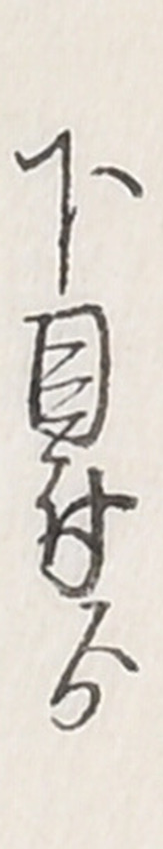下目付ゟ
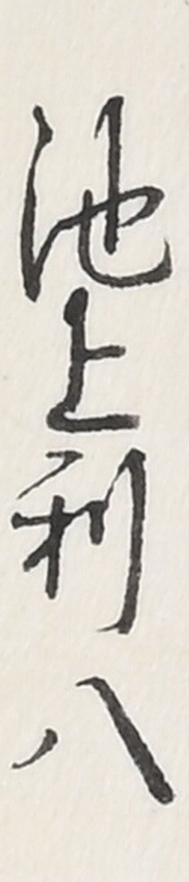池上利八
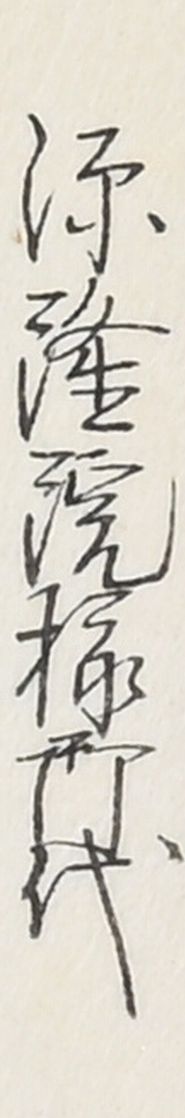源隆院様御代
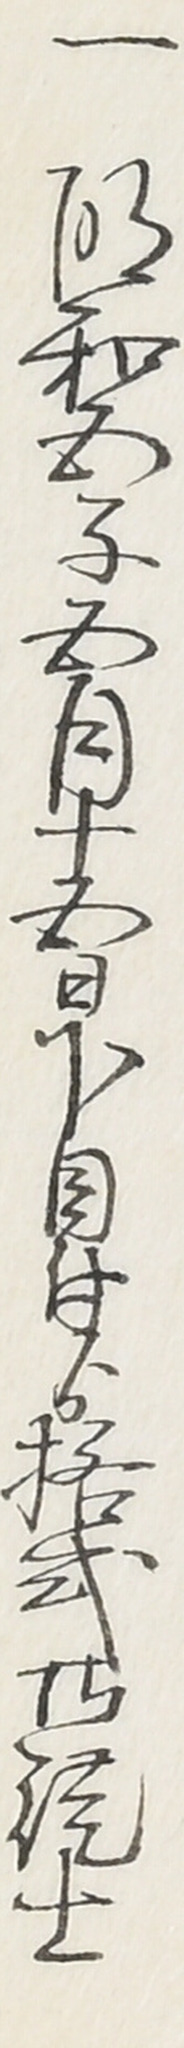一明和五子五月十五日下目付ゟ格式御徒士
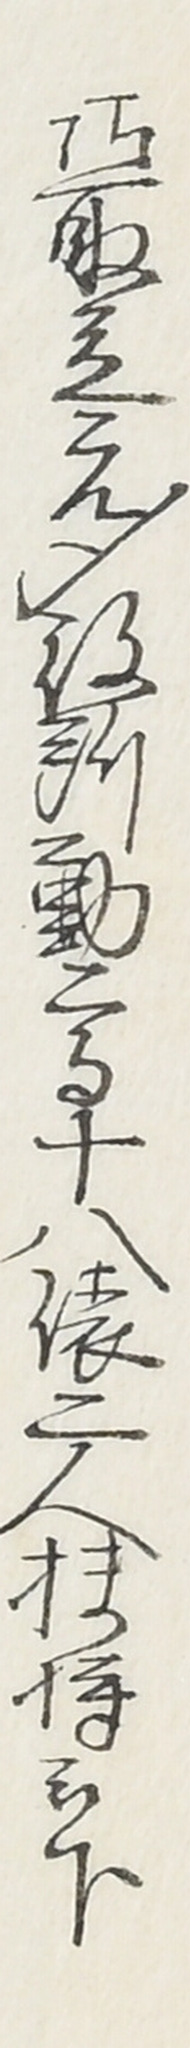御取立元〆役所勤高十八俵二人扶持被下
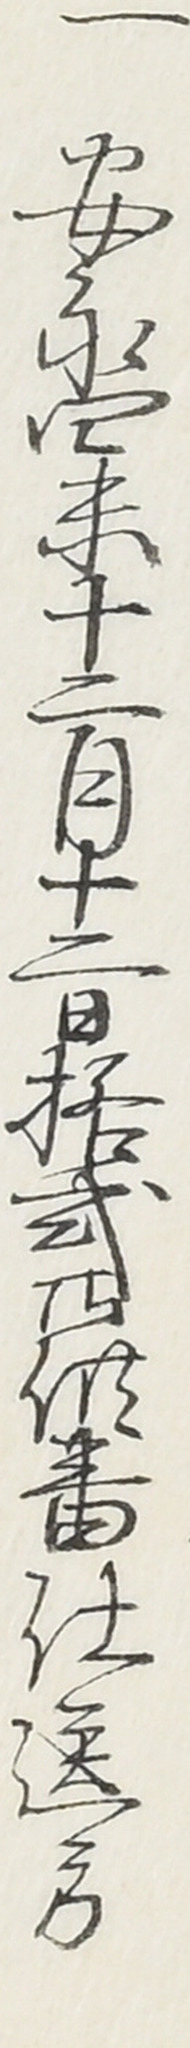一安永四未十二月十二日格式御供番仕送方
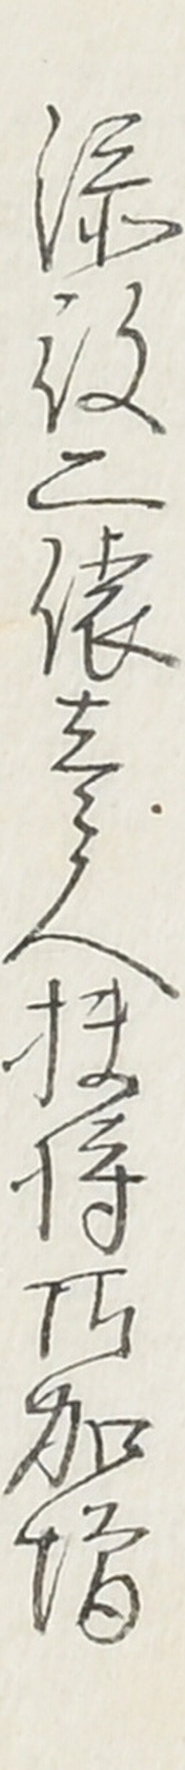添役二俵壱人扶持御加増
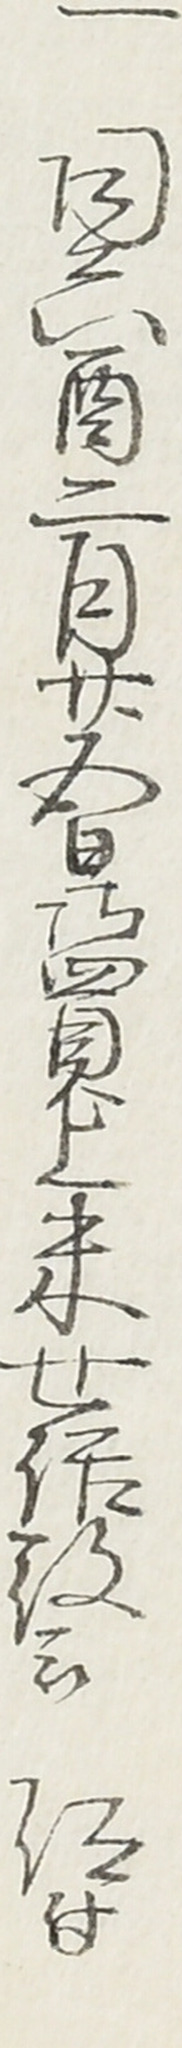一同六酉二月廿五日御買上米世話役被仰付
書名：無足諸士勤仕録（四）
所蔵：伊那市立高遠町図書館・合同会社AMANE
